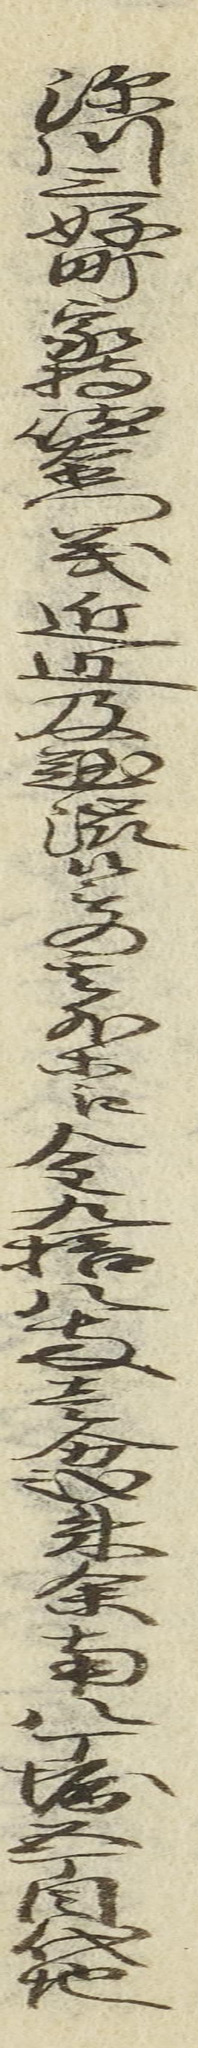一深川三好町家持徳右衛門義近辺及難渋候もの其外等江金九拾八両壱分弐朱余南八丁堀五丁目代地
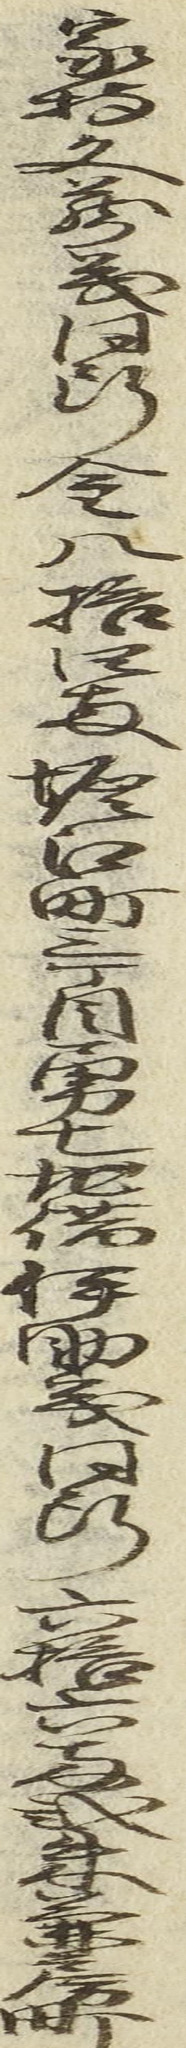家持久蔵義同断金八拾四両堀江町三丁目勇七地借伊助義同断六拾六両弐朱兼房町
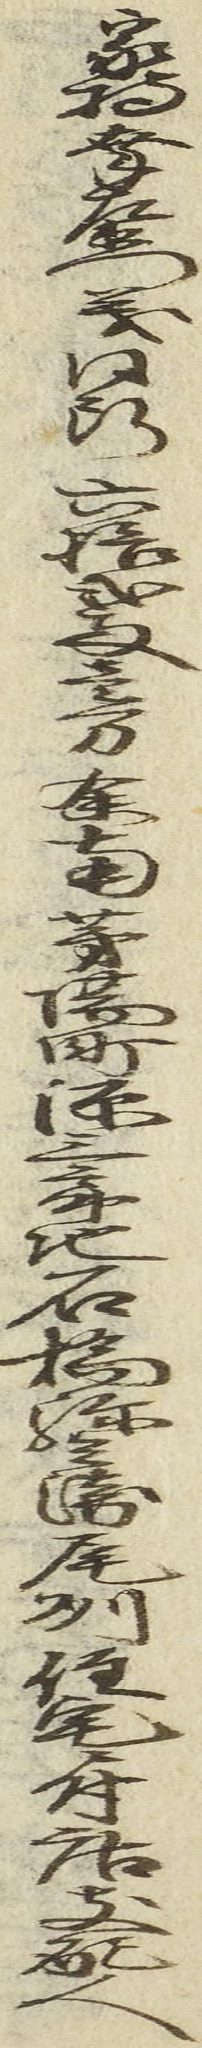家持幸左衛門義同断六拾弐両壱分余南茅場町源三郎地石橋弥兵衛尾州住宅ニ付店支配人
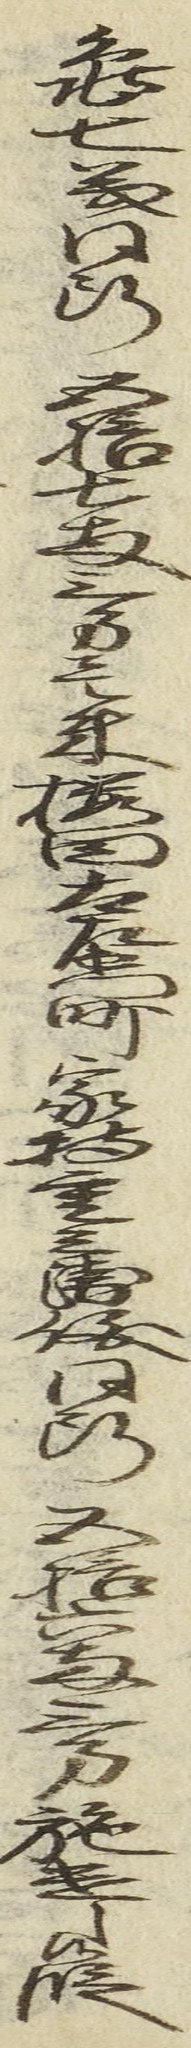亀七義同断五拾七両三分壱朱桜田太左衛門町家持重兵衛儀同断五拾六両三分施遣し候段
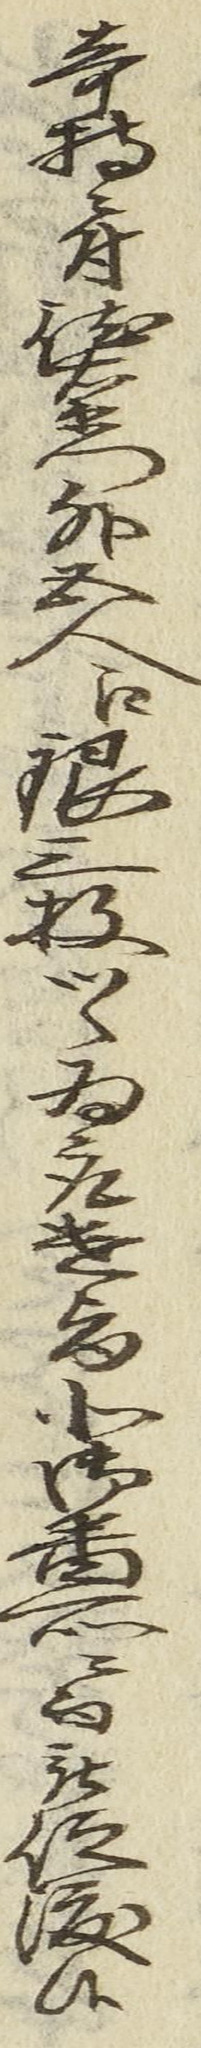奇特ニ付徳右衛門外五人江銀三枚ツゝ為取遣旨北御番所ニ而被仰渡候

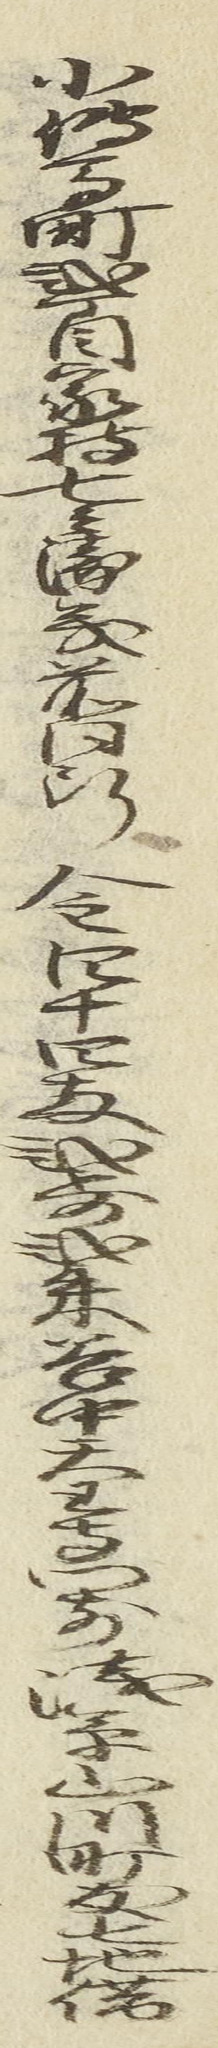一小伝馬町弐丁目七兵衛義前同断金四十四両弐歩弐朱谷中天王寺門前浅草山川町友七地借
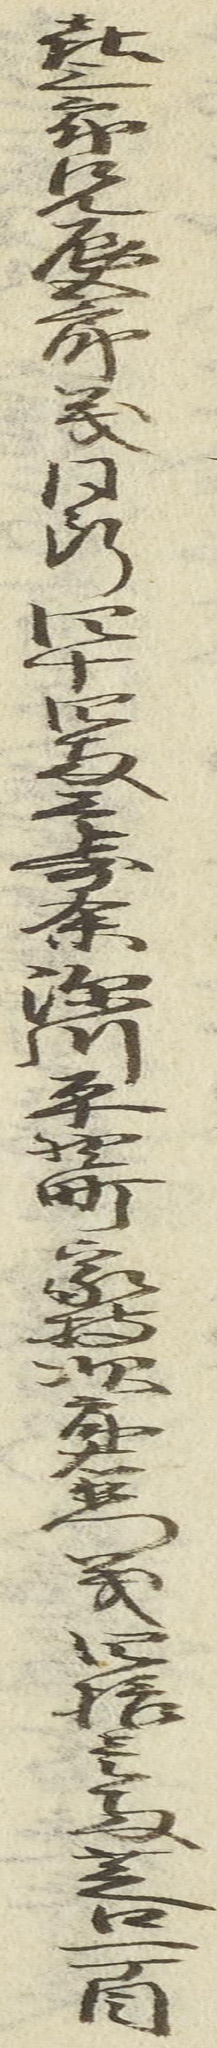喜三郎兄辰五郎義同断四十四両一歩余深川平野町家持次郎右衛門義四拾壱両芝口一丁目
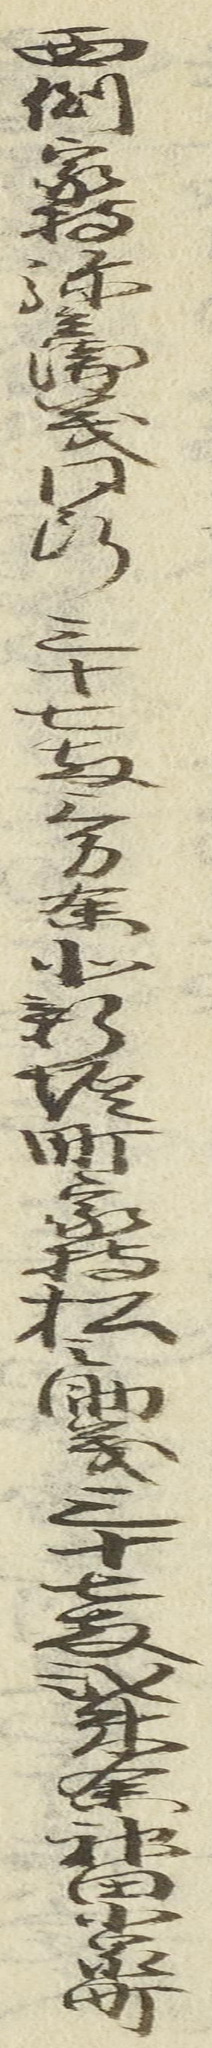西側家持弥兵衛義同断三十七両三分余北新堀町家持松之助義三十七両弐朱余神田小泉町
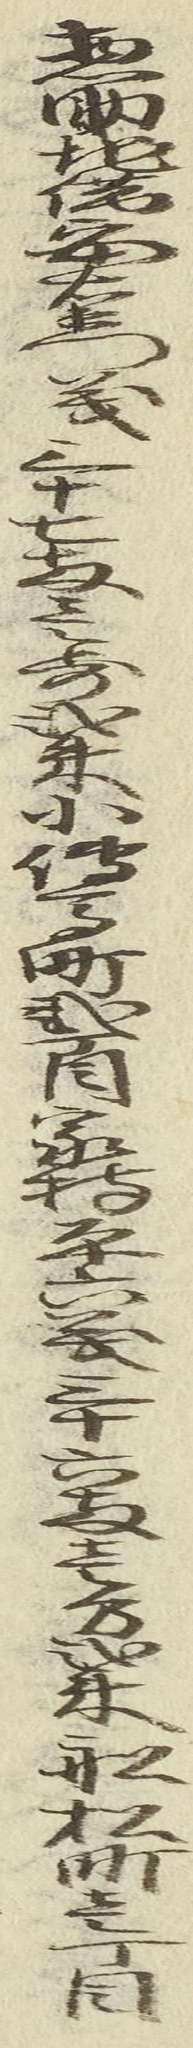惣助地借安右衛門義三十七両壱歩弐朱小伝馬町弐丁目家持平六義三十六両壱分弐朱船松町壱丁目
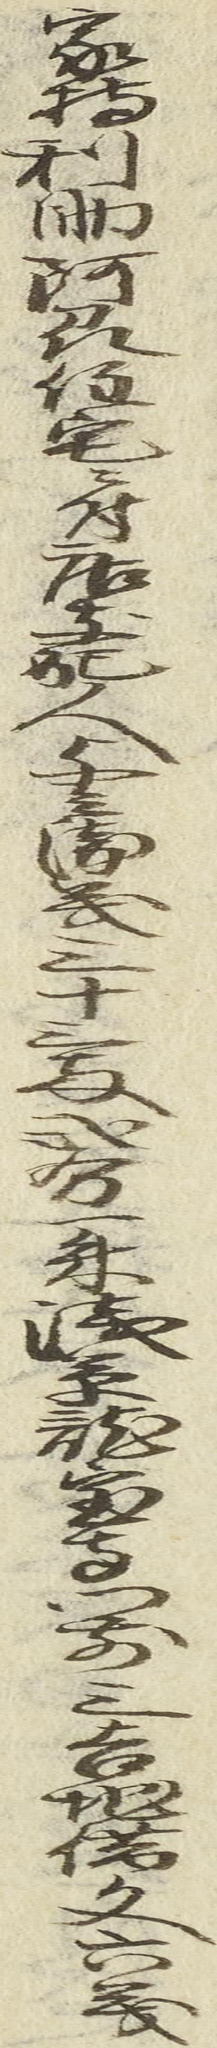家持利助阿州住宅ニ付店支配人与兵衛義三十三両弐分一朱浅草竜宝寺門前三吉地借文六義
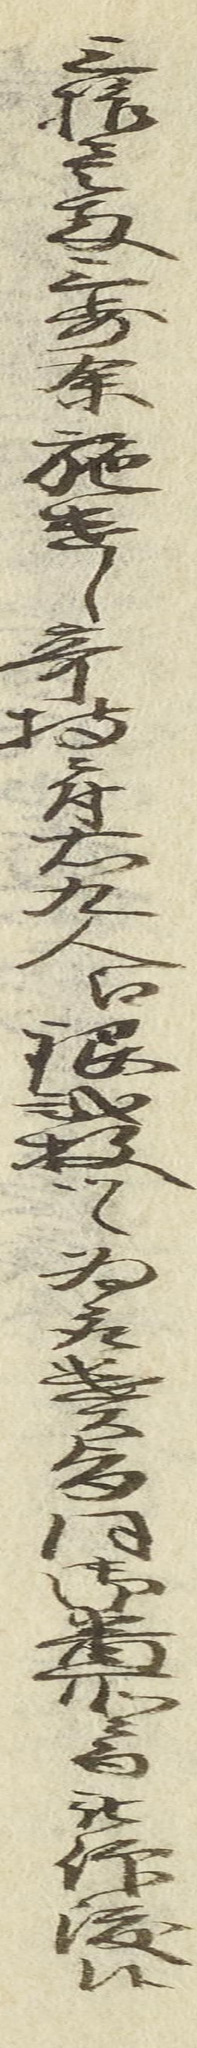三拾壱両三歩余施遣し奇特ニ付右九人江銀弐枚ツヽ為取遣ス旨同御番所二而被仰渡候
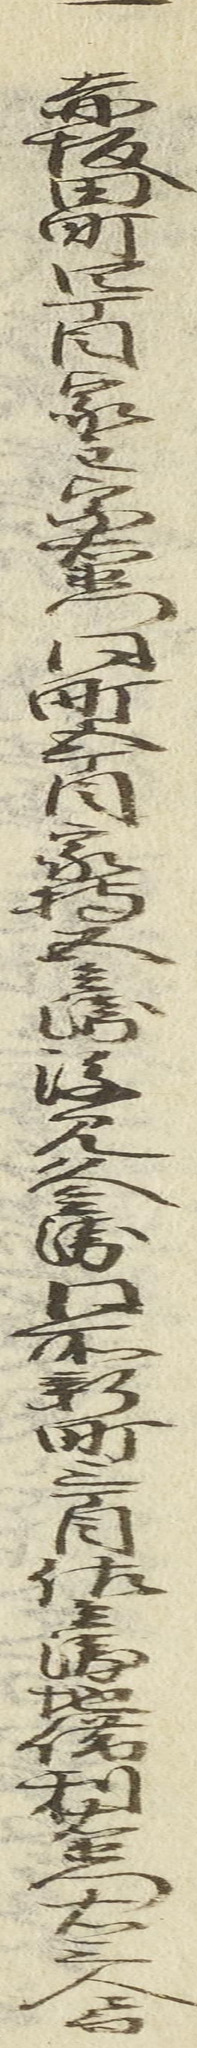一赤坂田町四丁目家主宗右衛門同町五丁目家持五兵衛後見久兵衛同所新町三丁目佐兵衛地借利右衛門右三人二而
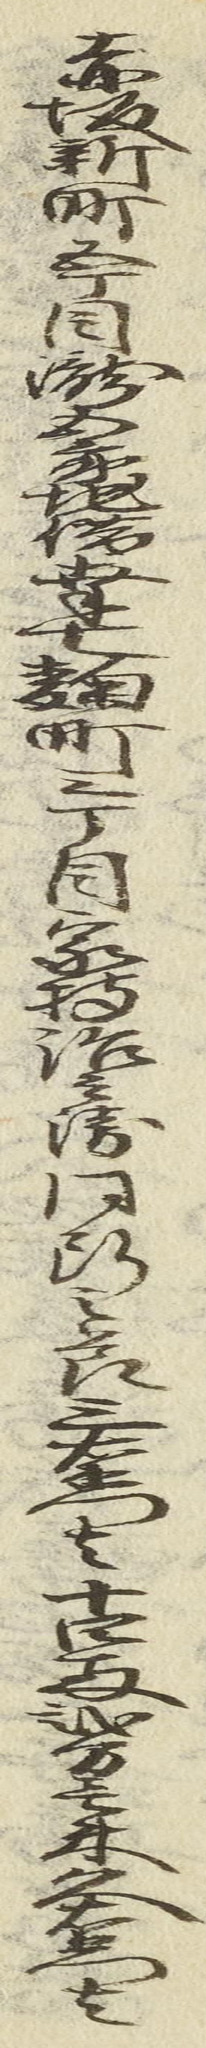赤坂新町五丁目瀧五郎地借幸七麹町三丁目家持治兵衛同断之節三右衛門者十四両弐分壱朱久右衛門者
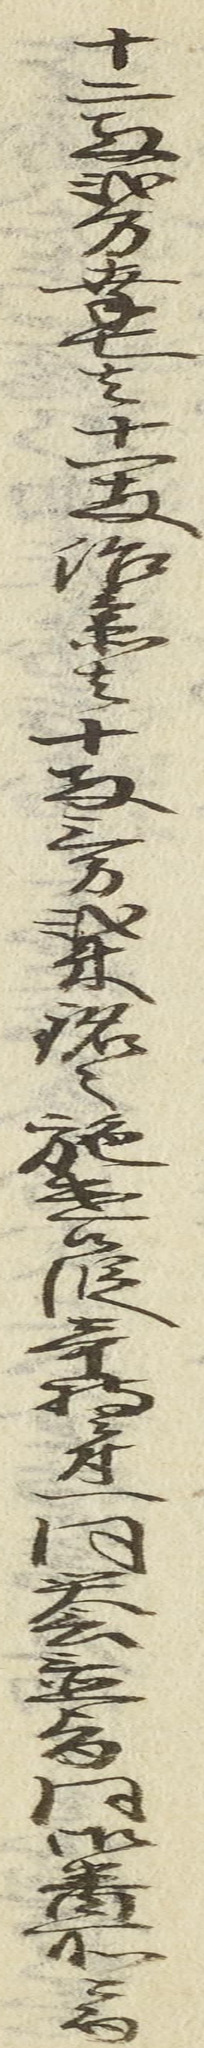十二両弐分幸七者十一両治兵衛者十両三分弐朱銘々施遣候段奇特ニ付一同誉置旨同御番所二而
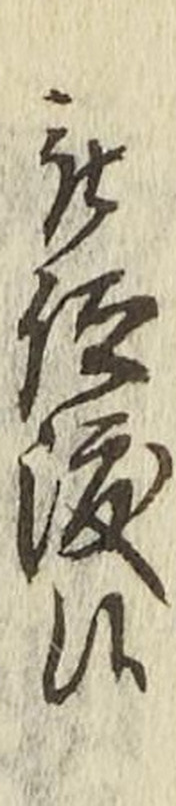被仰渡候
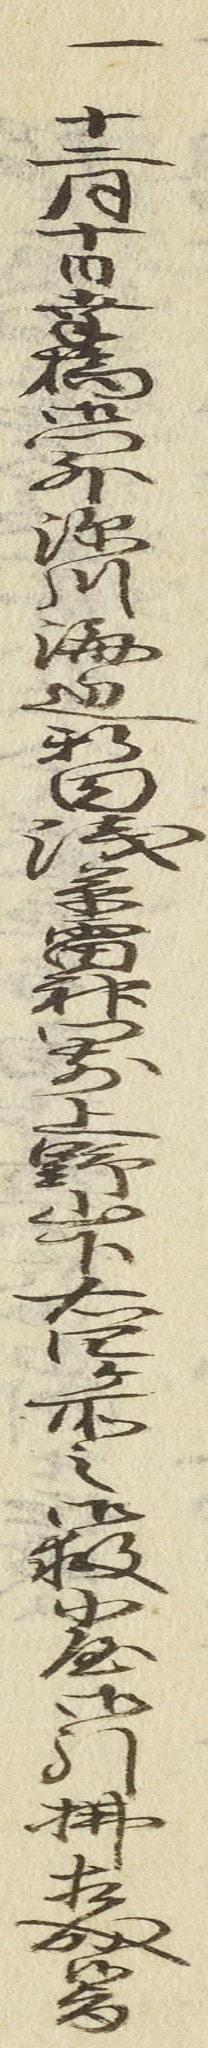一十二月十日幸橋御門外深川海辺新田浅草雷神門前上野山下右四ケ所之御救小屋御引払相成候旨
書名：安政二年震災記事　完
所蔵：東京大学地震研究所図書室 Earthquake Research Institute Library, The University of Tokyo, JAPAN
